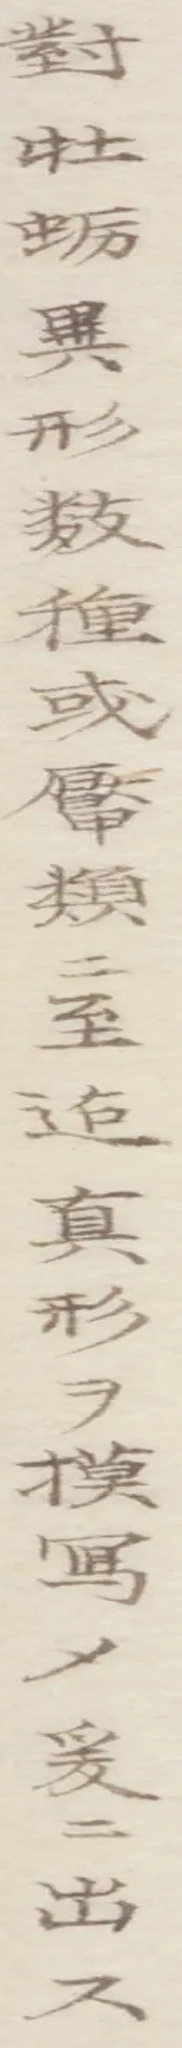對牡蛎異形数種或厴類ニ至近真形ヲ模写シテ爰ニ出ス
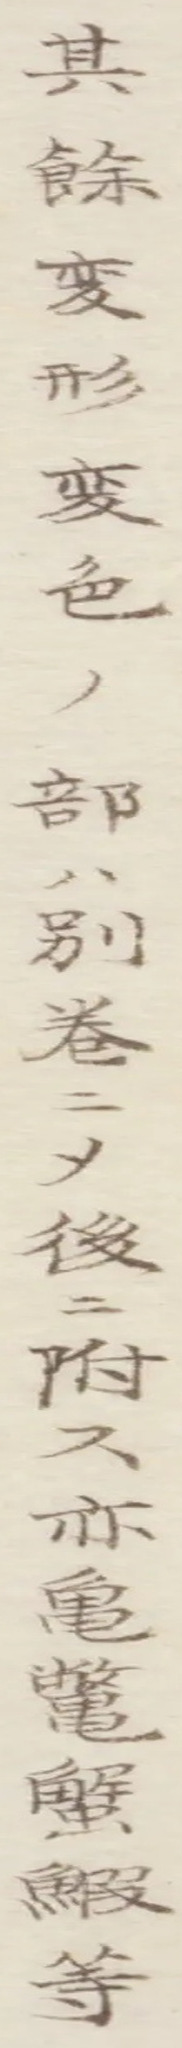其余変形変色ノ部ハ別巻ニシテ後ニ附ス亦亀龞蟹鰕等
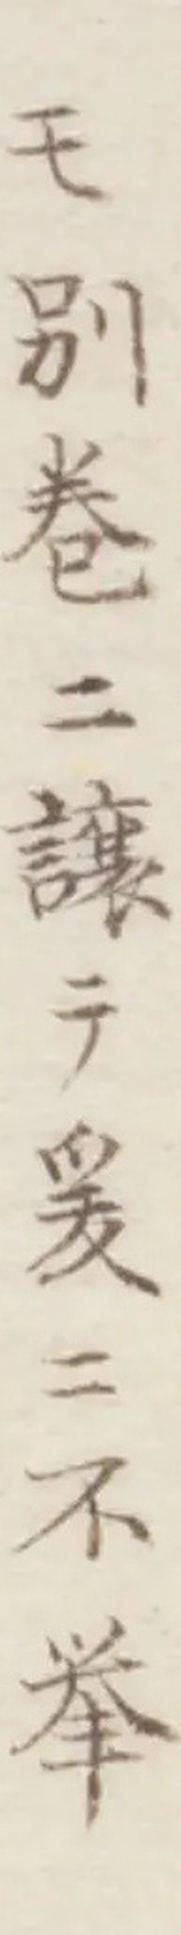モ別巻ニ譲テ爰ニ不挙
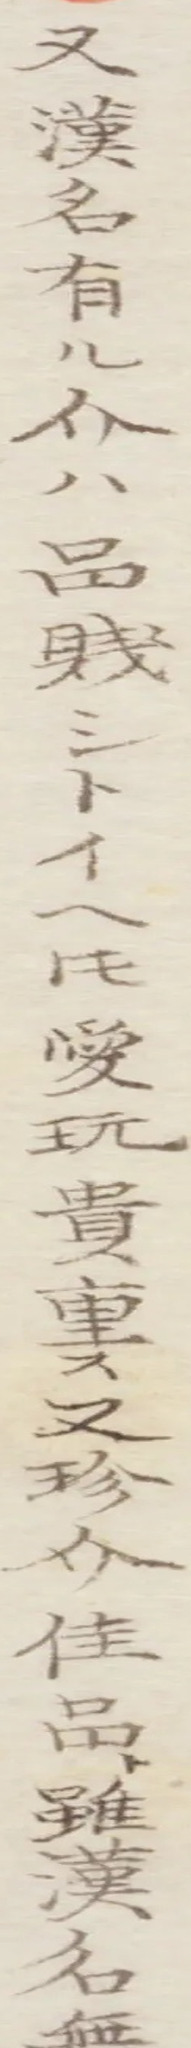○又漢名有ル介ハ品賎シトイヘトモ愛玩貴重ス又珍介佳品ト雖漢名無
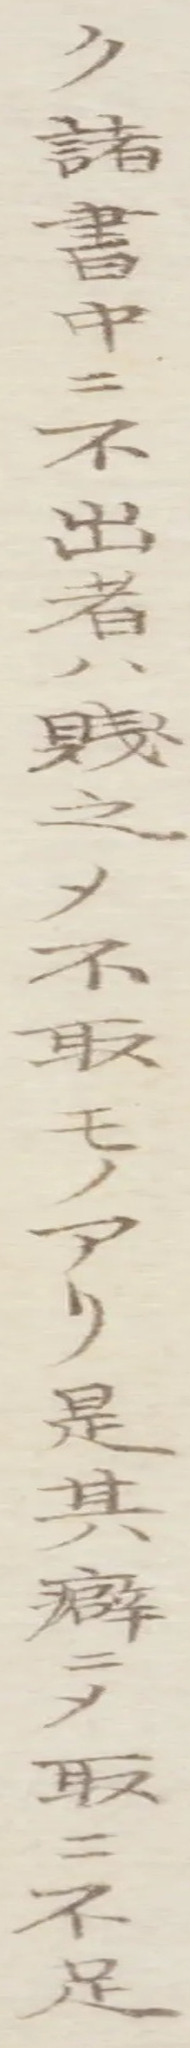ク諸書中ニ不出者ハ賎之シテ不取モノアリ是其癖ニシテ不足
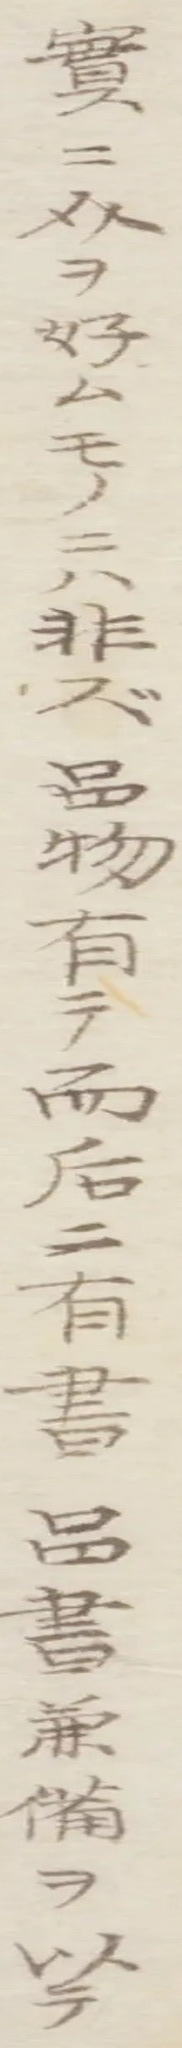実ニ介ヲ好ムモノニハ非ズ品物有テ而后ニ有書品書兼備ヲ以テ
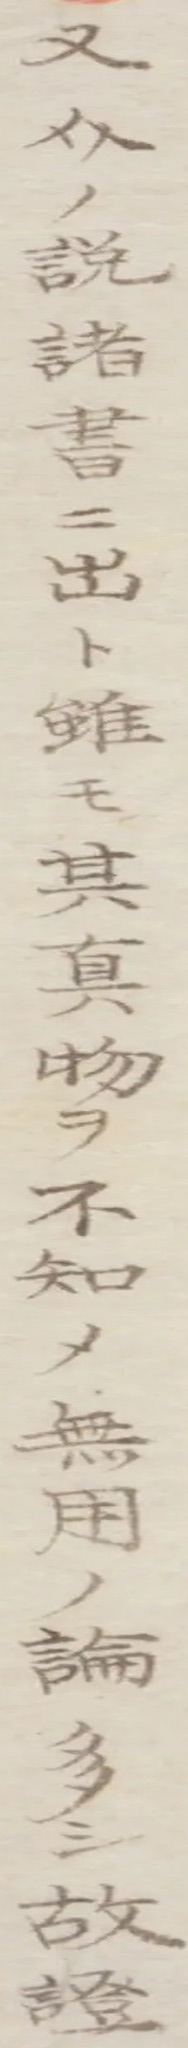○又介ノ説諸書ニ出ト雖モ其真物ヲ不知シテ無用ノ論多シ故証
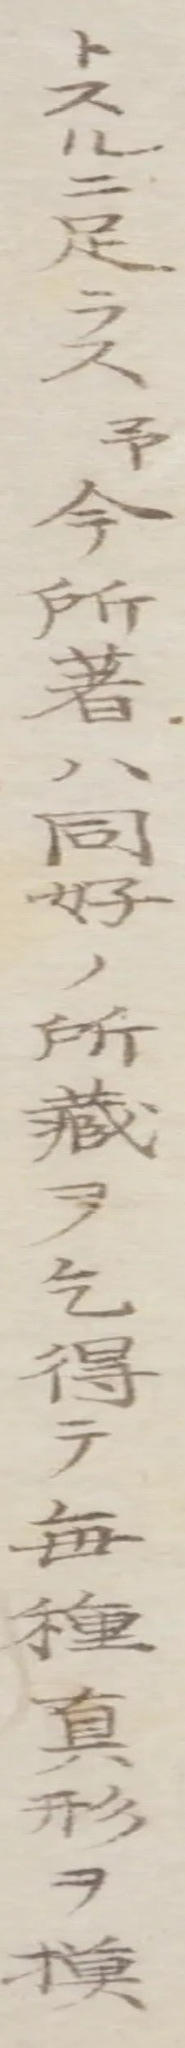トスルニ足ラス予今所著ハ同好ノ所蔵ヲ乞得テ毎種真形ヲ模
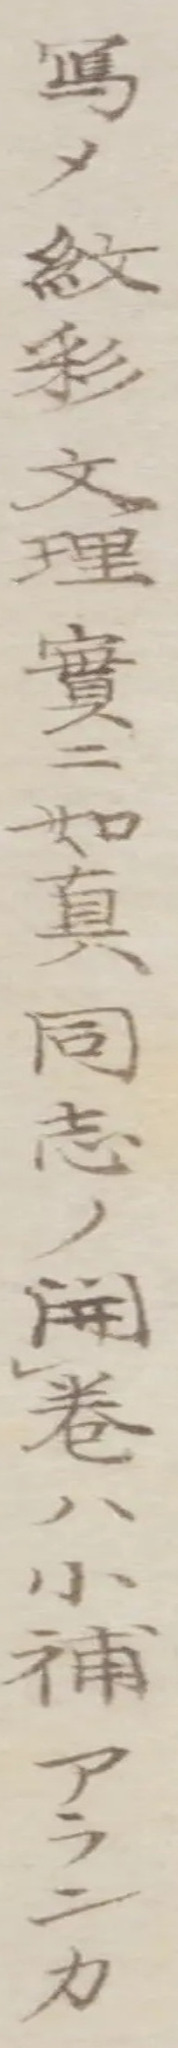写シテ紋彩文理実ニ如真同志ノ開巻ハ小補アランカ
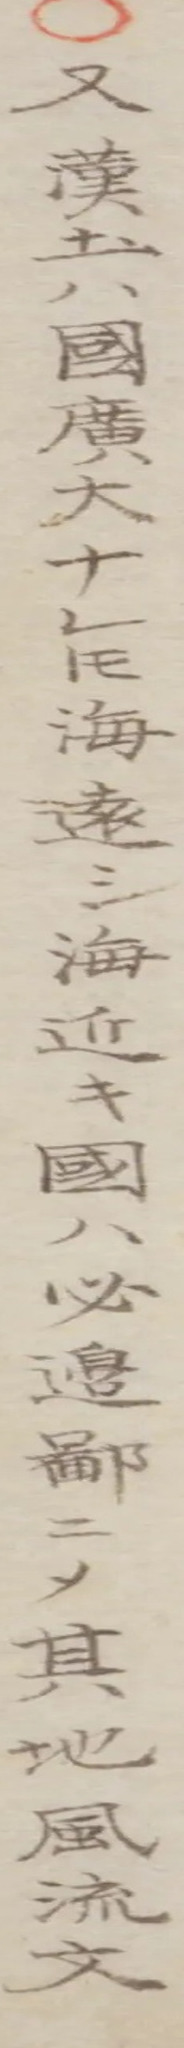○又漢土ハ国広大ナレトモ海遠シ近キ国ハ必辺鄙ニシテ其地風流文

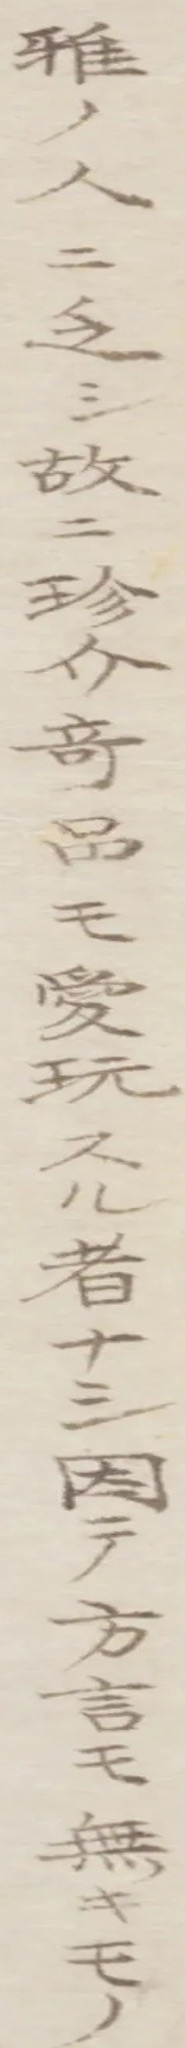雅ノ人ニ乏シ故ニ珍介奇品モ愛玩スル者ナシよって因テ方言モ無キモノ
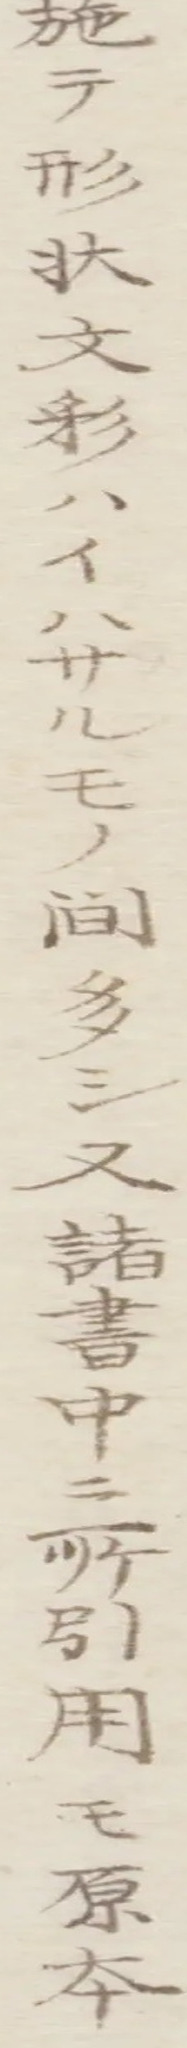施テ形状文彩ハイハサルモノ間多シ又諸書中ニ所引用モ原本ノ
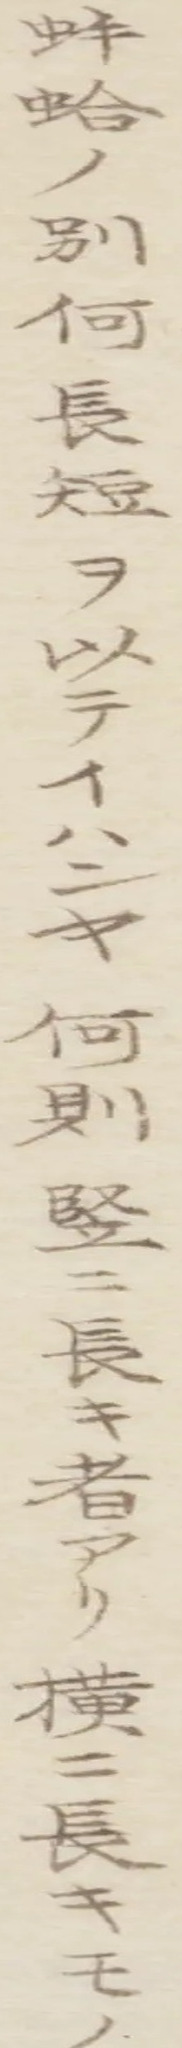蚌蛤ノ別何長短ヲ以テイハンヤ何則竪ニ長キ者アリ横ニ長キモノ
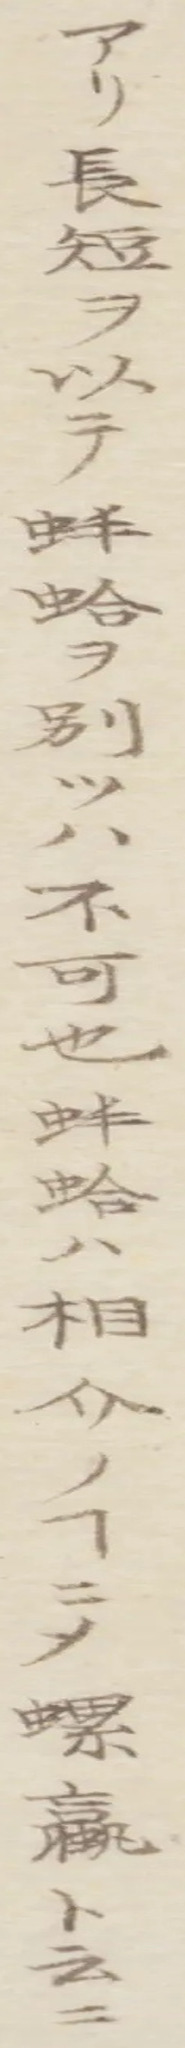アリ長短ヲ以テ蚌蛤ヲ別ツハ不可也蚌蛤ハ相介ノコトニシテ螺蠃トイフニ
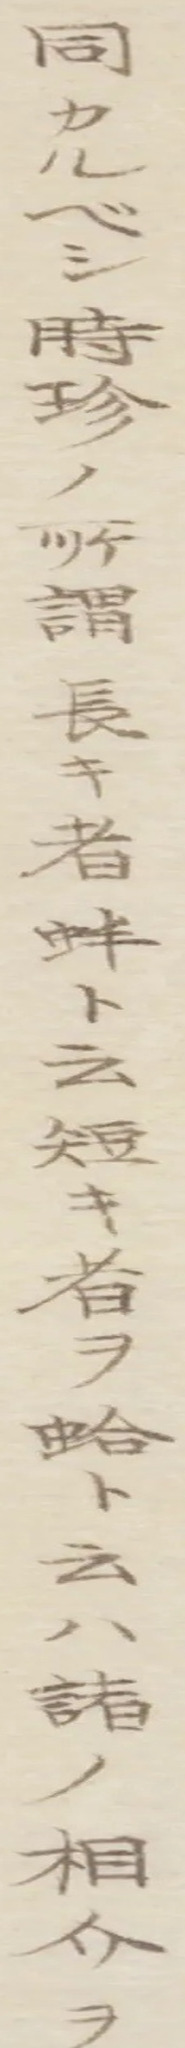同カルベシ時珍ノ所謂長キ者蚌トイフ短キ者ヲ蛤トイフハ諸ノ相介ヲ
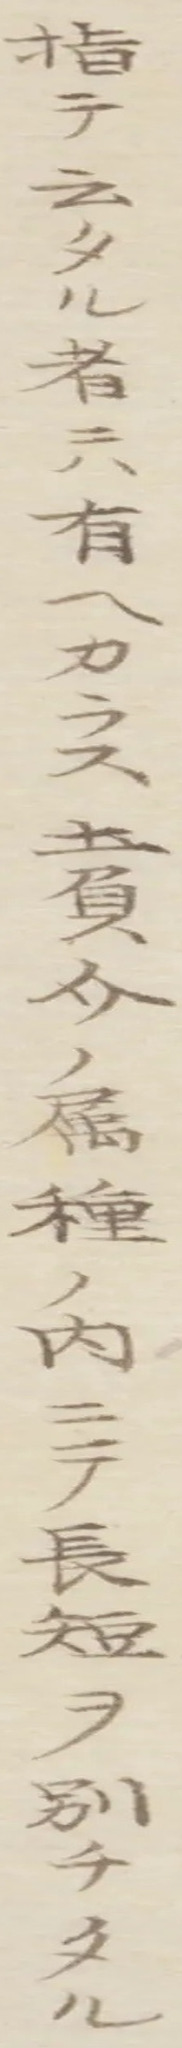指テイフタル者ニハ有ヘカラス土負介ノ属種ノ内ニテ長短ヲ別チタル
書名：目八譜. 第１巻
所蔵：国立国会図書館 National Diet Library, JAPAN
